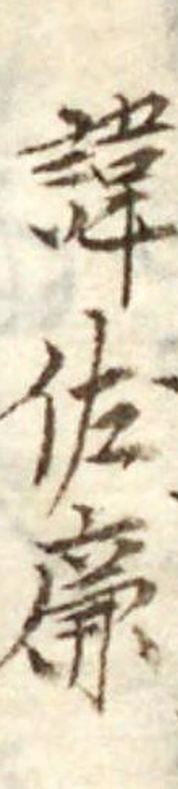諱佐廉
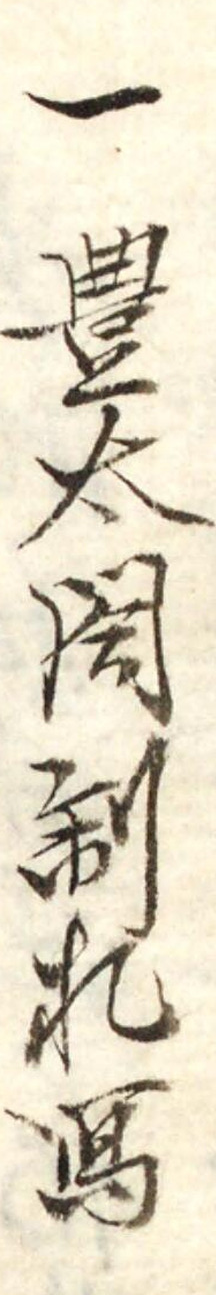一豊太閤制札写
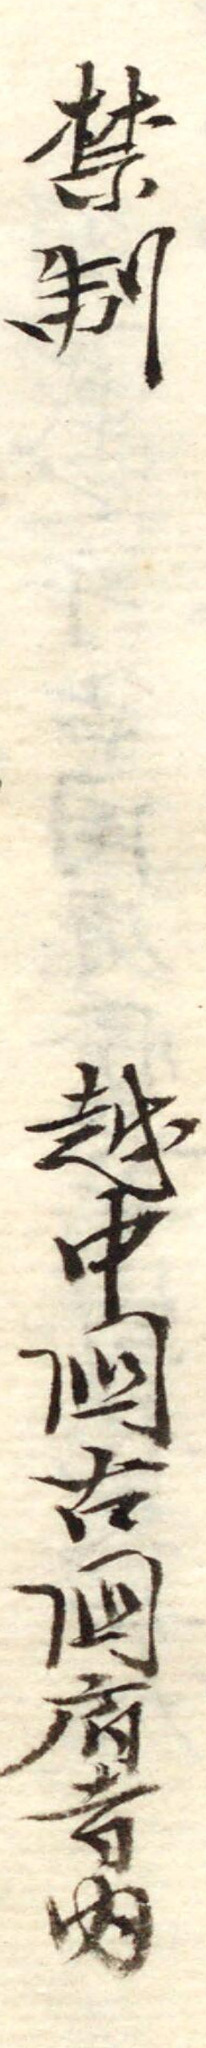禁制越中国古国府寺内
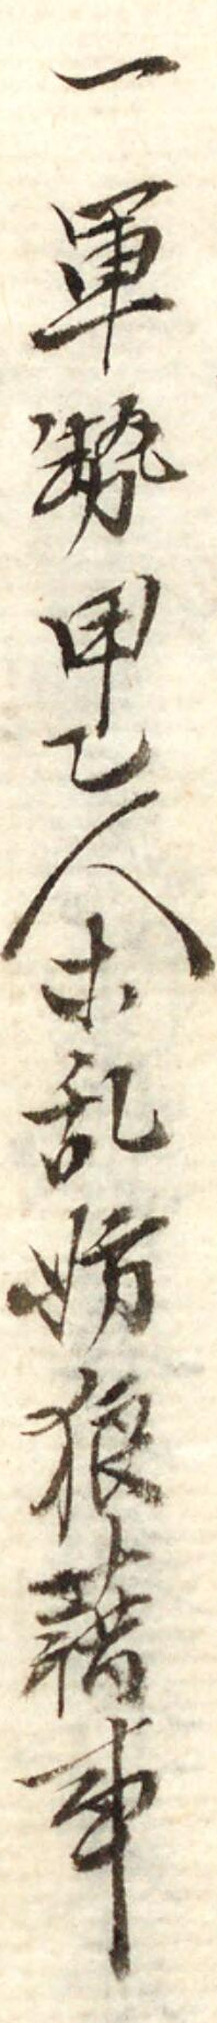一軍勢甲乙人等乱妨狼藉事
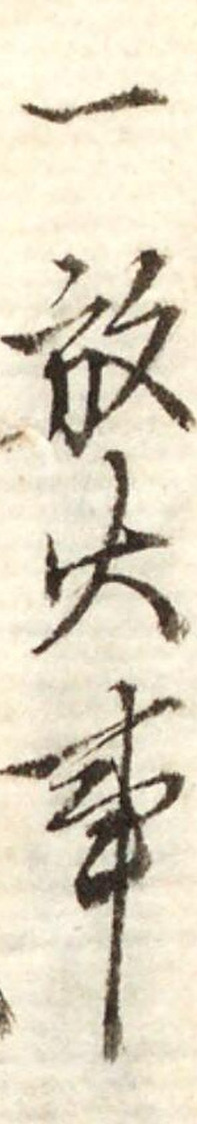一放火事
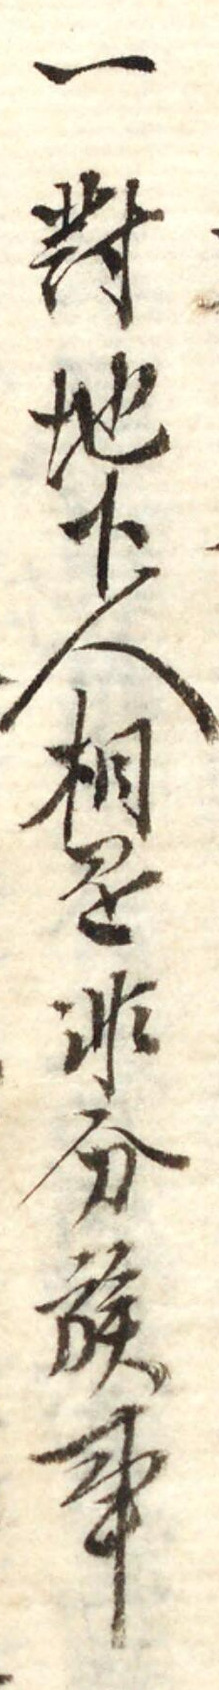一対地下人相懸非分族事
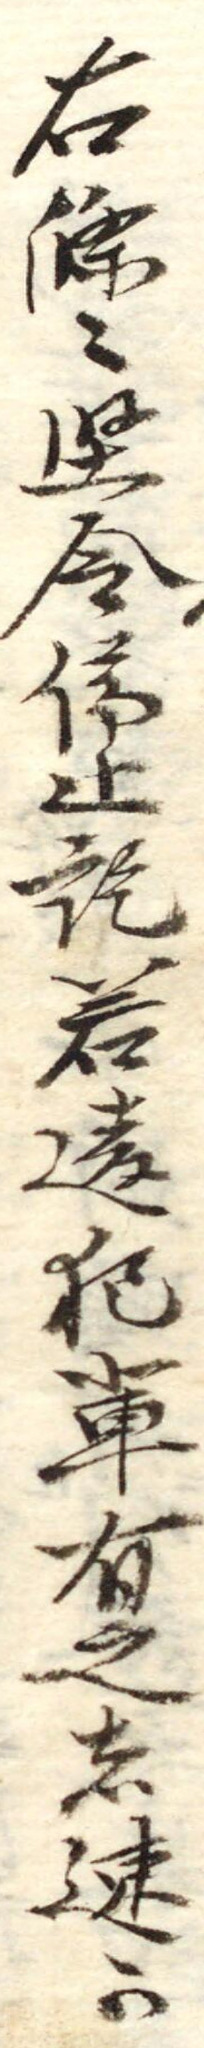右條々堅令停止訖若違犯輩有之者速可
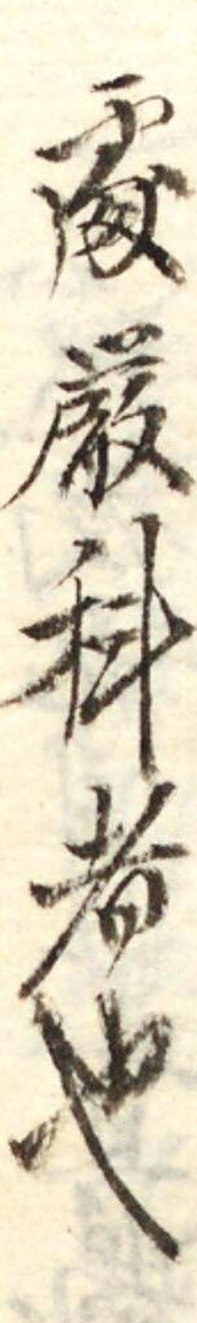處厳科者成
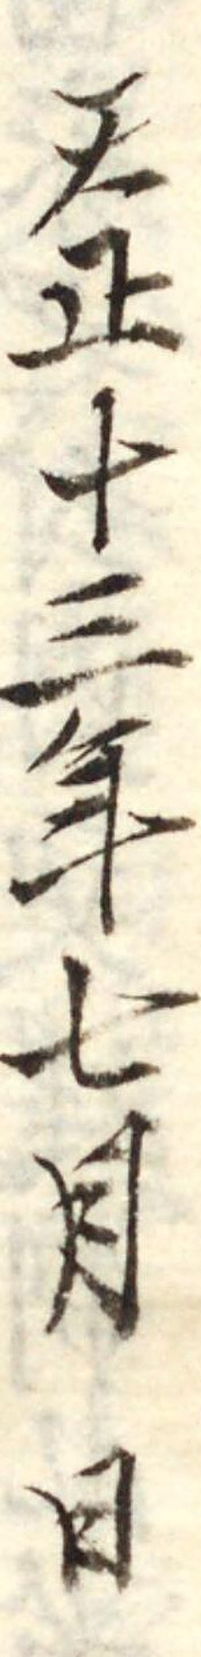天正十三年七月日
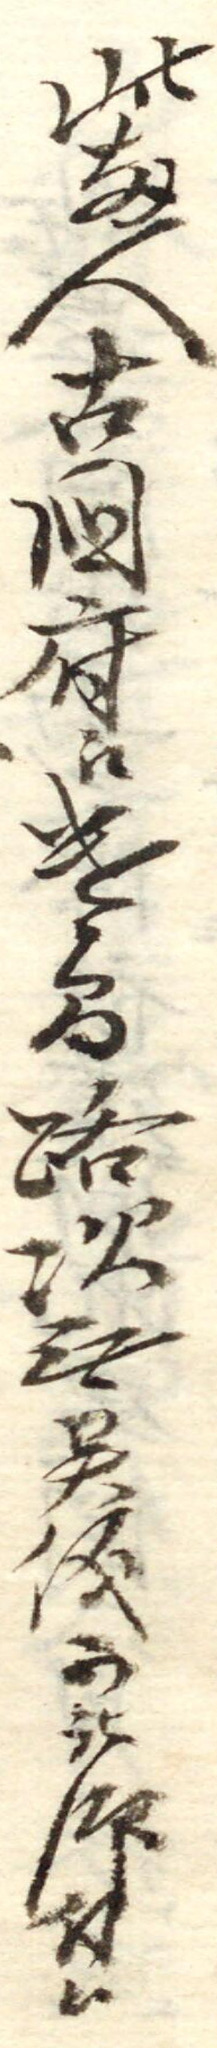此両人古国府江遣候間路次無異儀可被仰付候
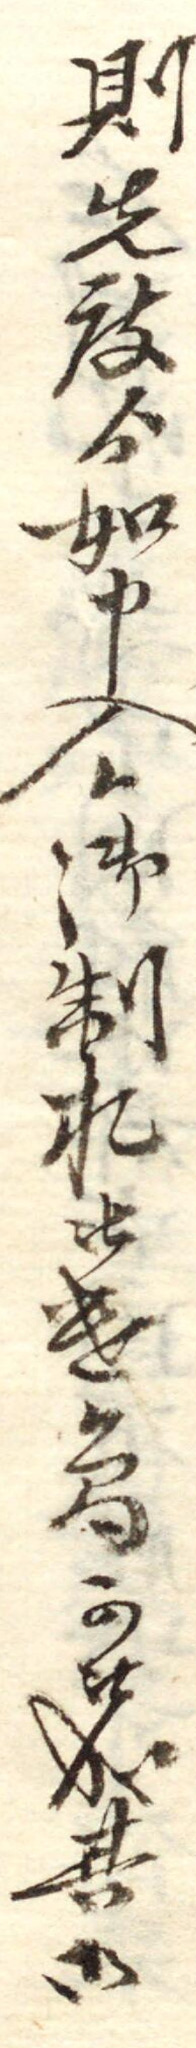即先度ゟ如申入候御制札被遣候間可被成其御
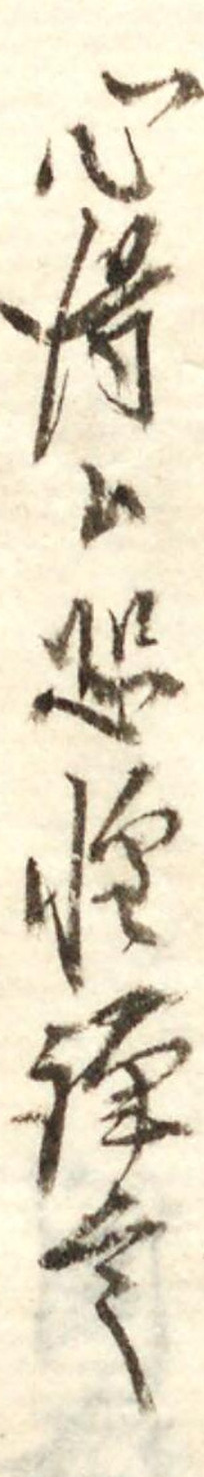心得候恐惶謹言
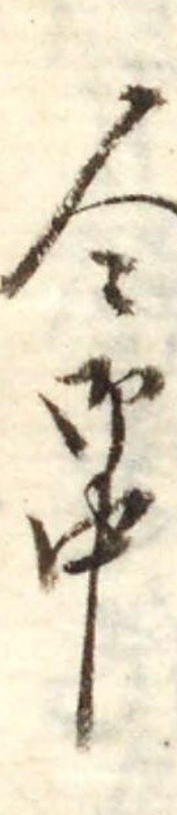人々御中
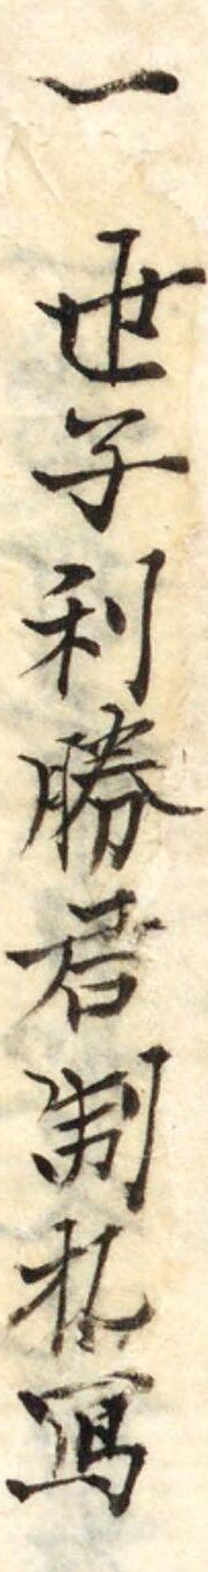一世子利勝君制札写
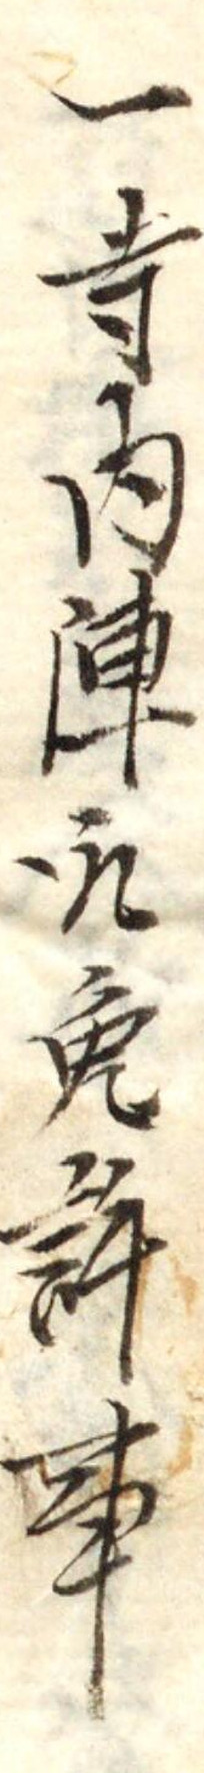一寺内陣取免許事
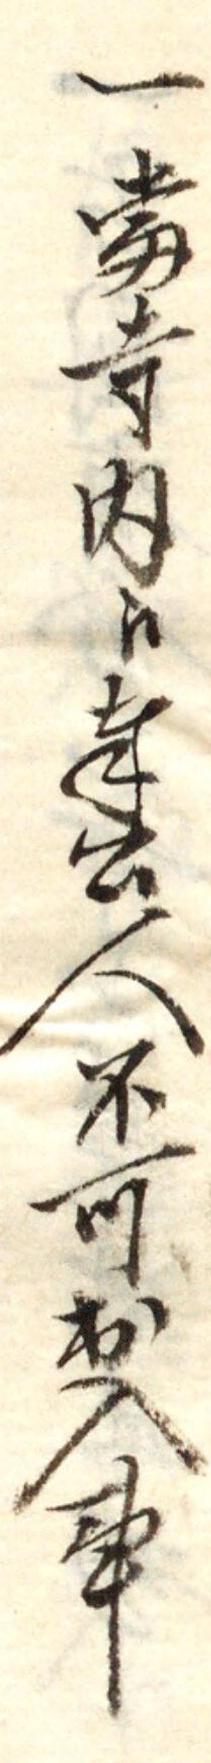一当寺内江奉公人不可出入事
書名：前田家封国証書集録
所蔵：Ishikawa Prefectural Library
